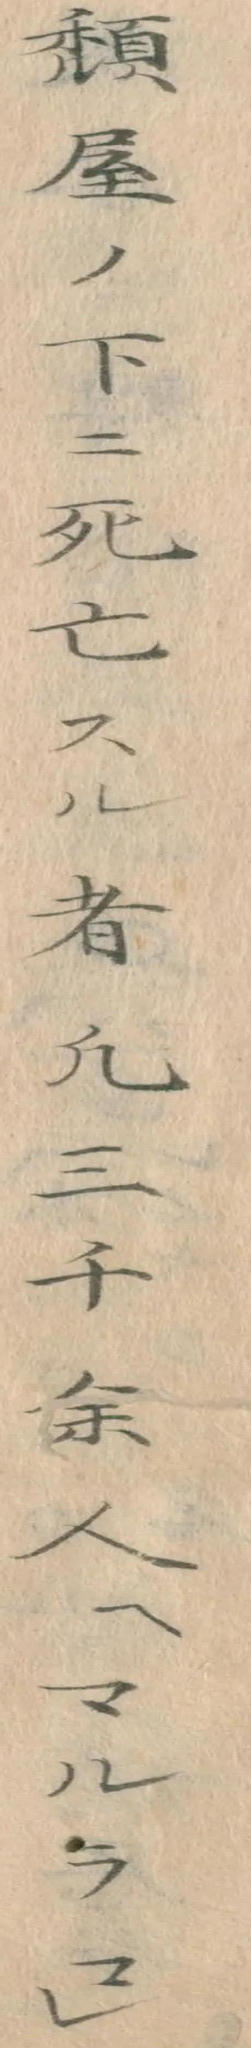頽屋ノ下ニ死亡スル者凡三千余人「マルラマ」
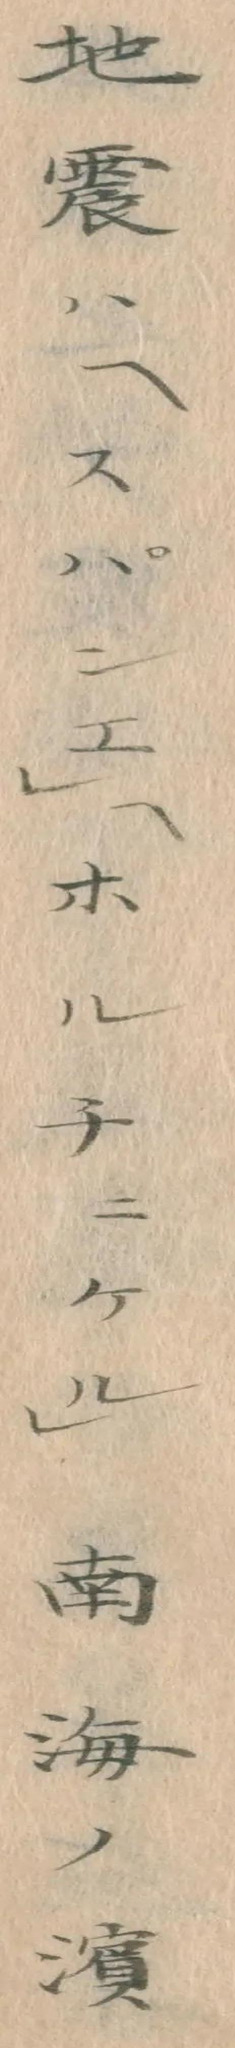地震ハ「スパンエ」「ホルチュケル」南海ノ浜
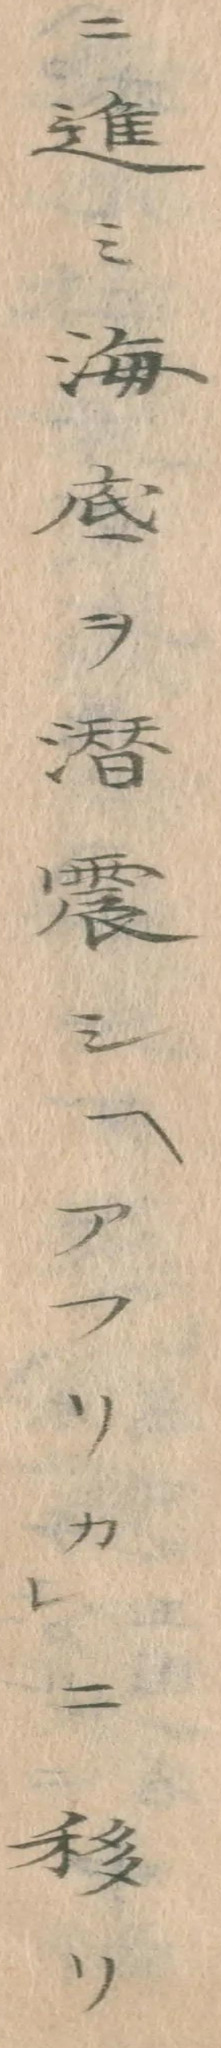ニ進ミ海底ヲ潜震シ「アフリカ」ニ移リ
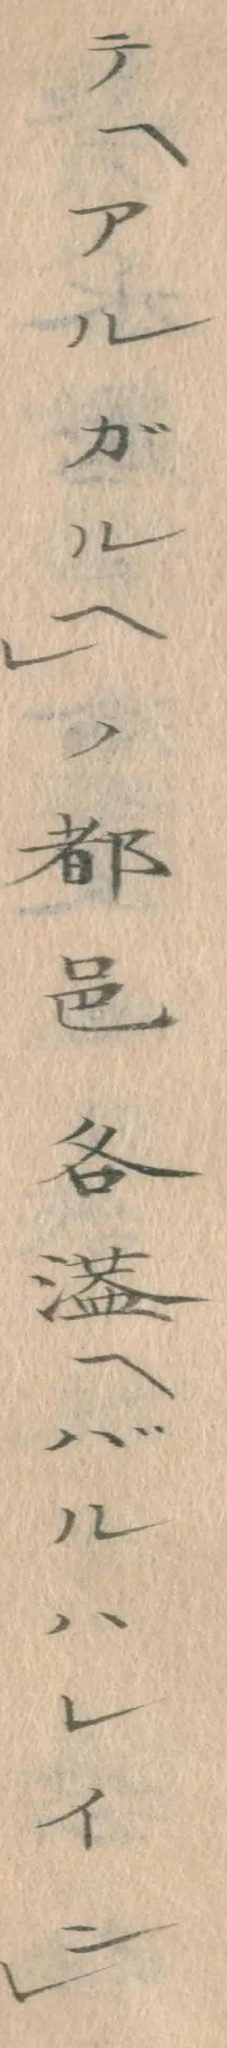テ「アルガルヘ」ノ都邑各「バルハレイン」
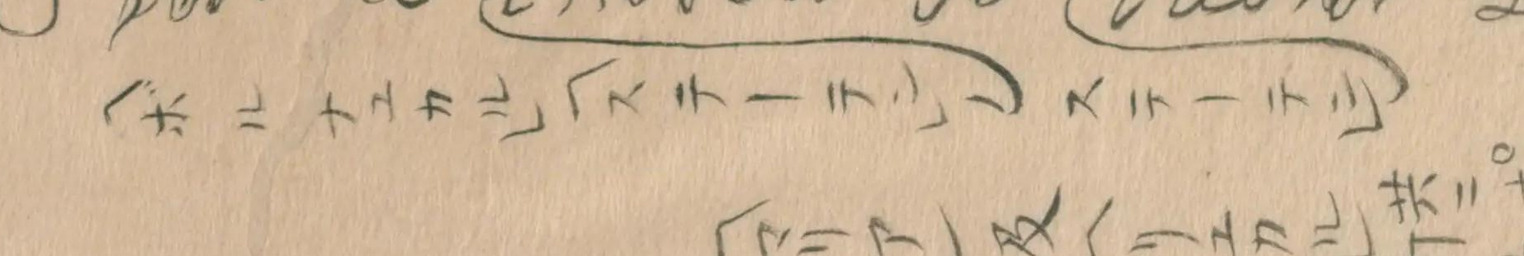「ボルナュカル」「ステーテン」ノステーテン」
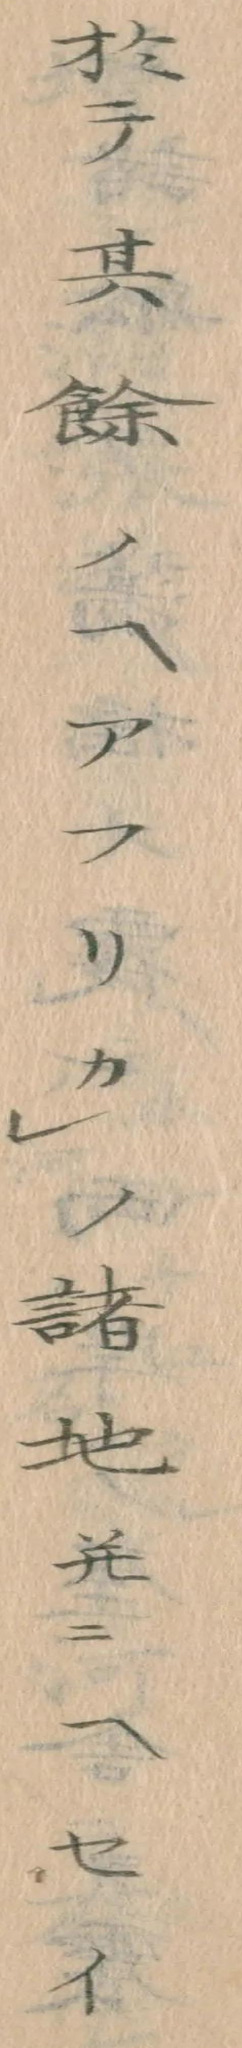於テ其余ノ「アフリカ」ノ諸地并ニ「セイ
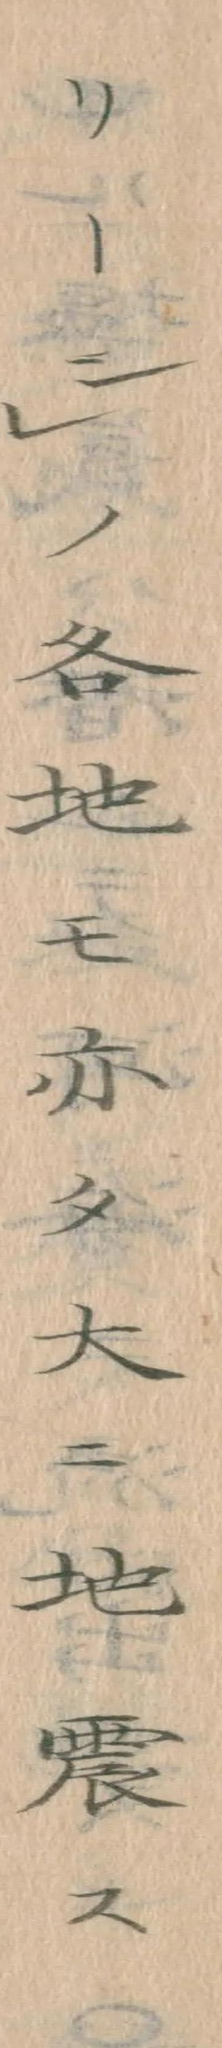リーン」ノ各地モ亦タ大ニ地震ス
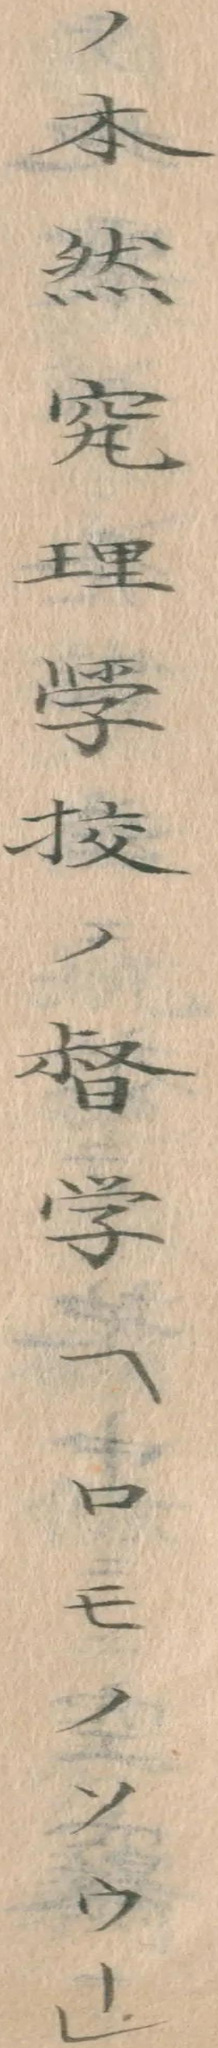ノ本然究理学校ノ督学「ロモノソウー」
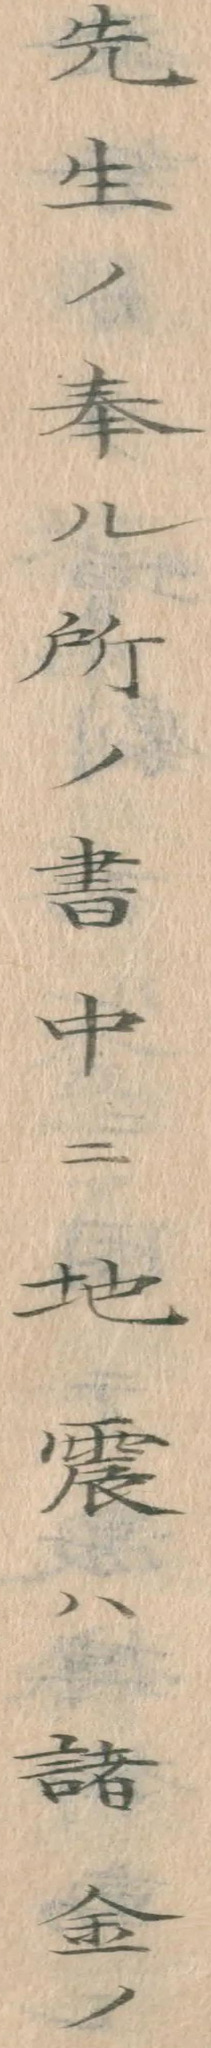先生ノ奉ル所ノ書中ニ地震ハ諸金ノ
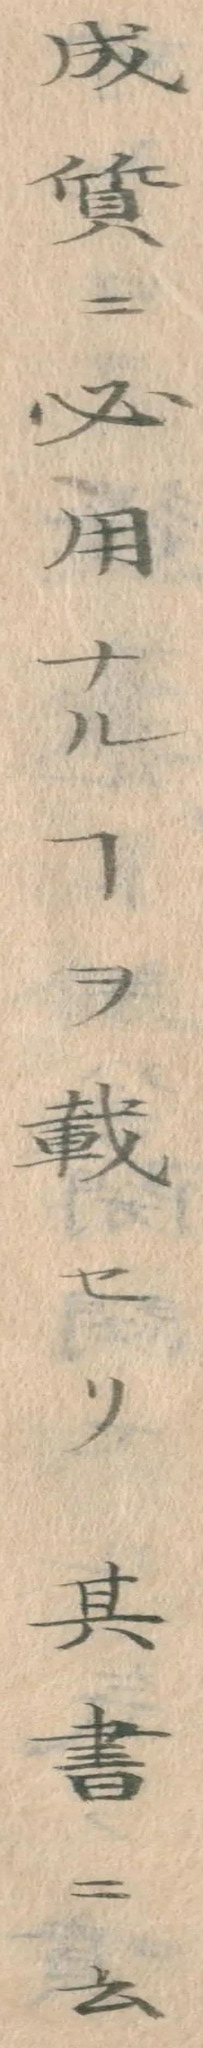成質ニ必用ナル事ヲ載セリ其書ニ云
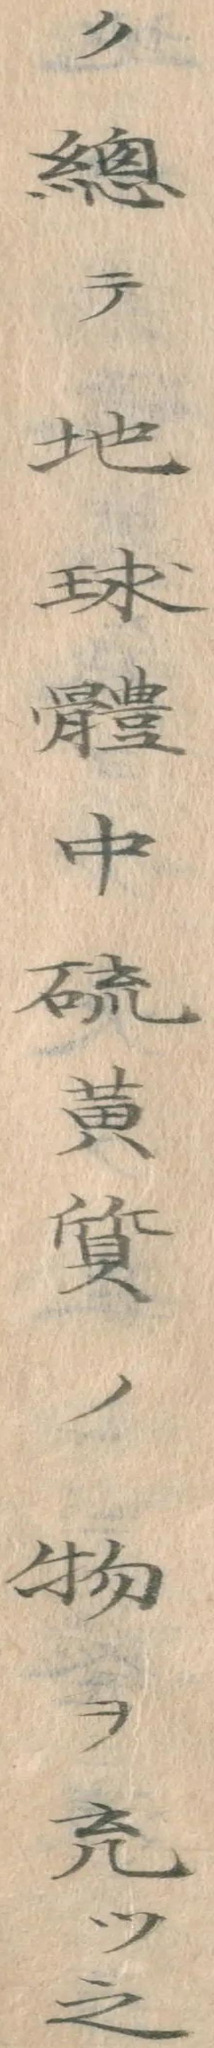ク総テ地球体中硫黄質ノ物ヲ充ツ之
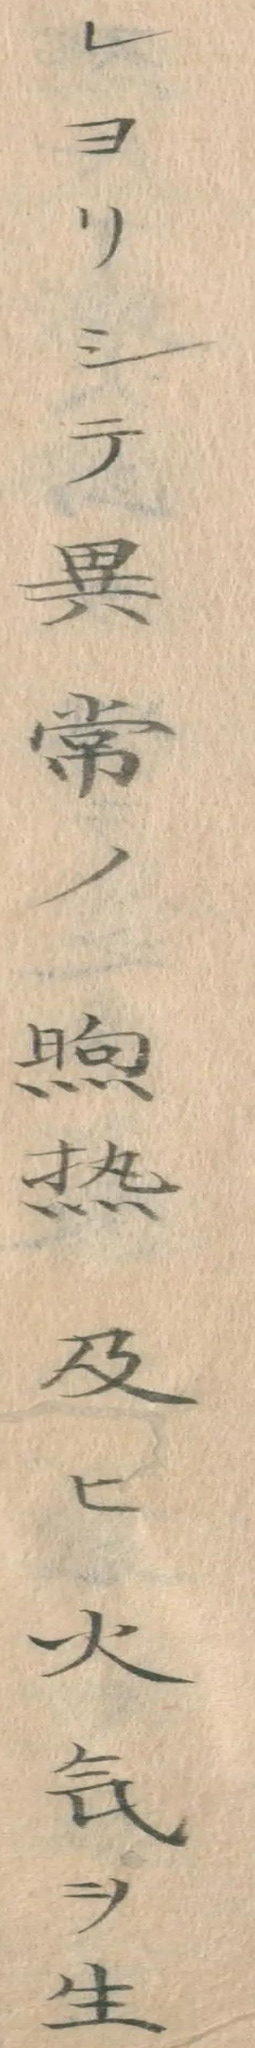レヨリシテ異常ノ煦熱及ヒ火ヲ生

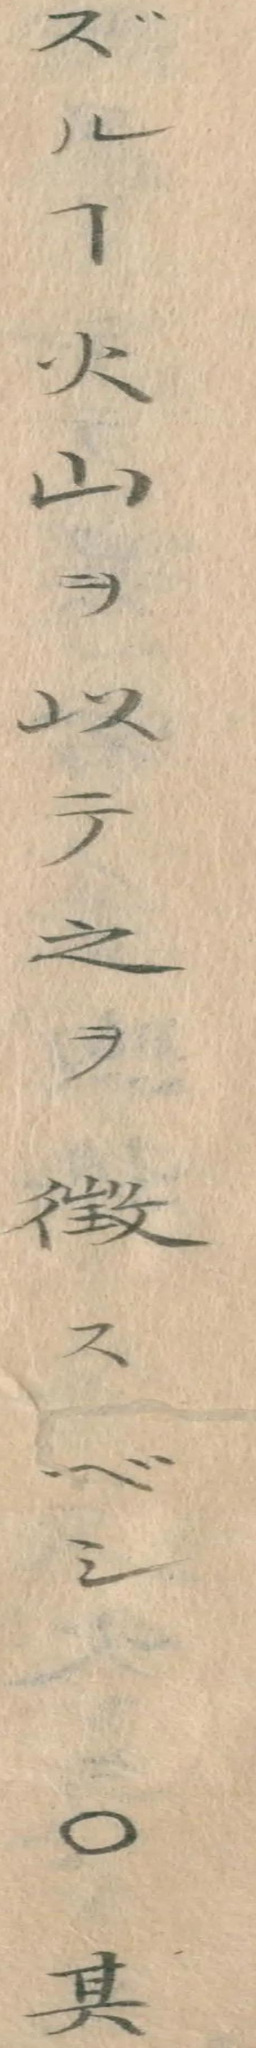スル事火山ヲ以テ之ヲ徴スベシ○其
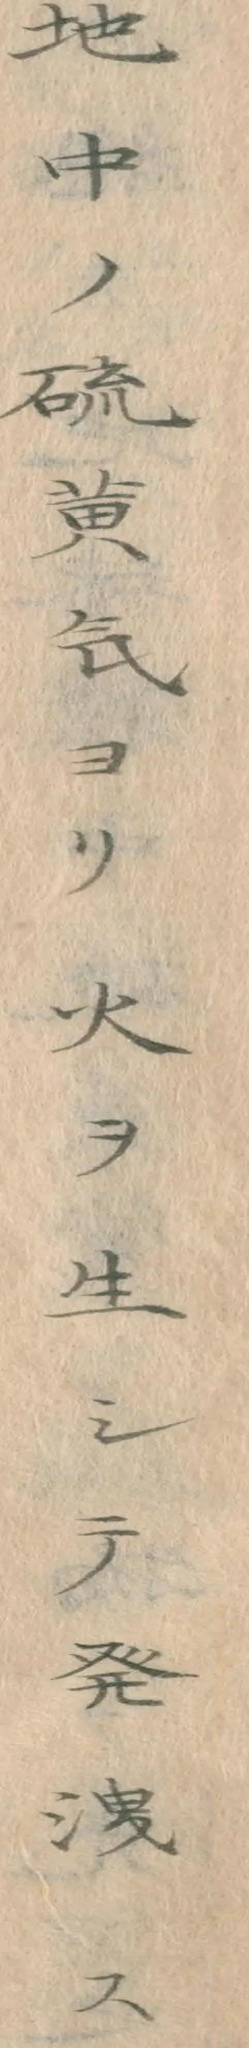地中ノ硫黄ヨリ火ヲ生シテ発洩ス
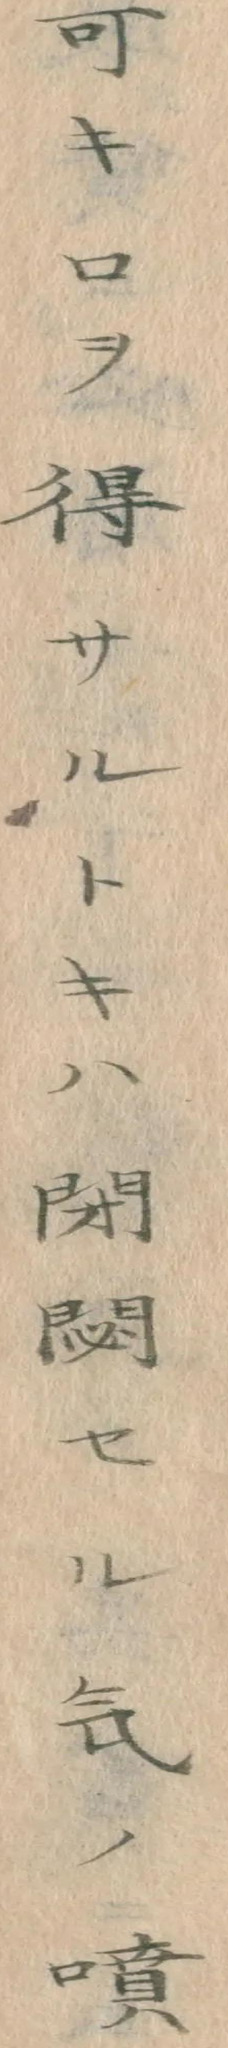可キ口ヲ得サルトキハ閉悶セルノ噴
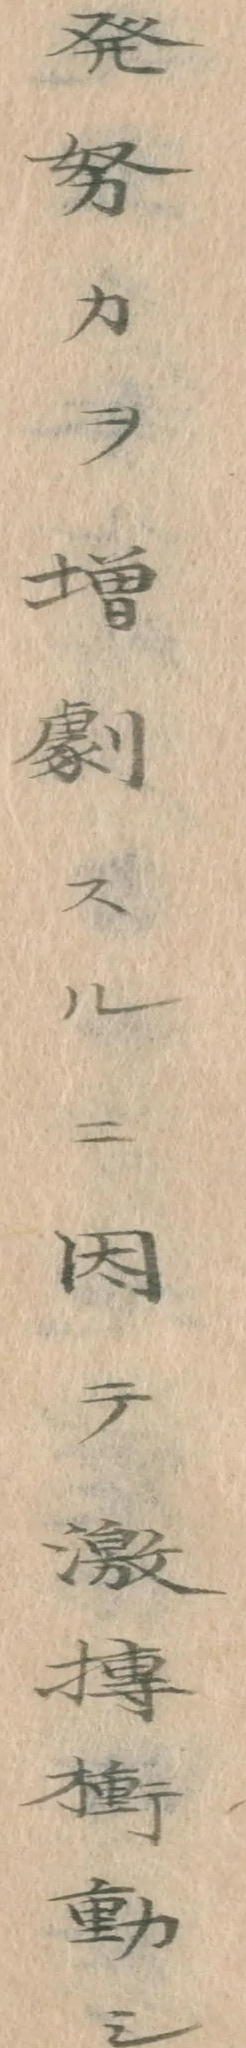発努力ヲ増劇スルニ因テ激搏シ
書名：輪池叢書. 12
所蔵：国立国会図書館 National Diet Library, JAPAN
